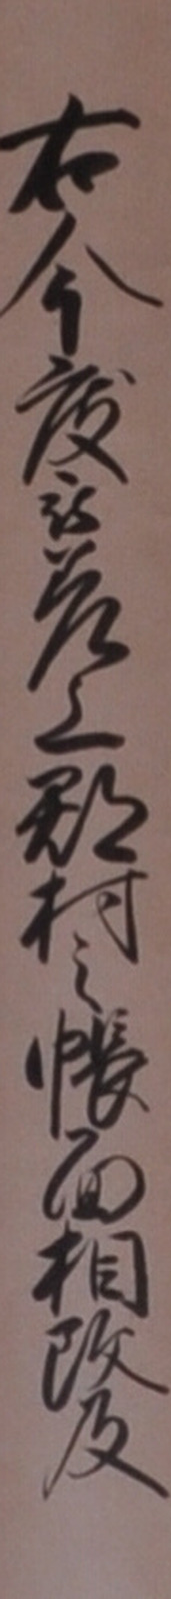右今度被差上郡村之帳面相改及
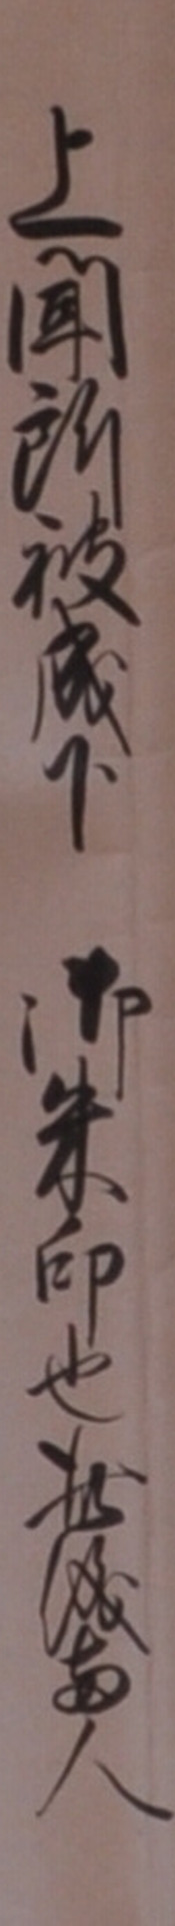上聞所被成下御朱印也此儀両人
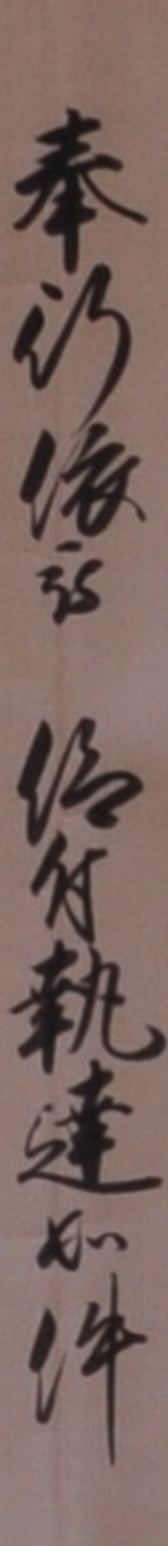奉行依被仰付執達如件
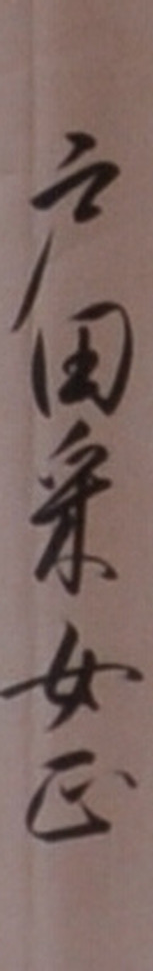戸田采女正
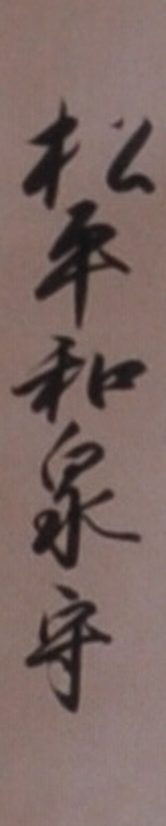松平和泉守
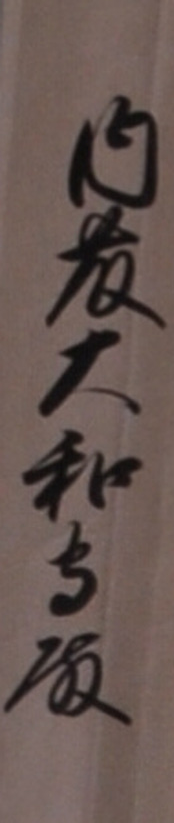内藤大和守殿

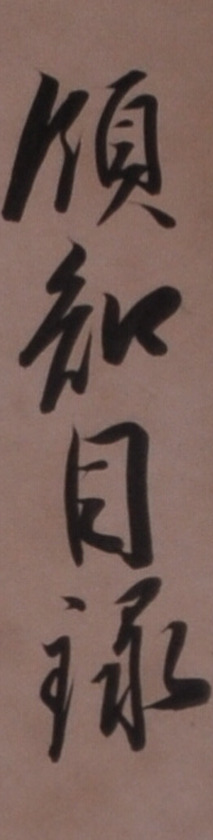領知目録
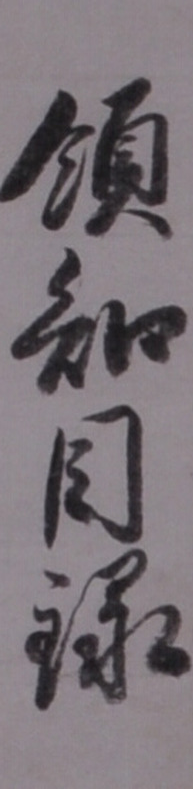領知目録

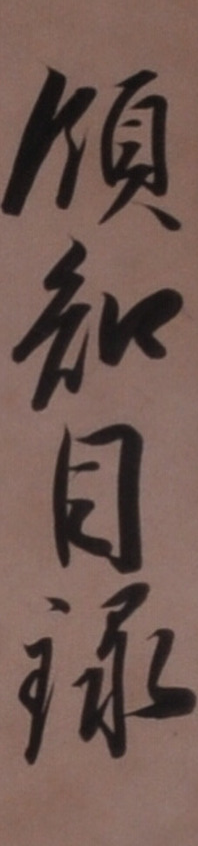領知目録
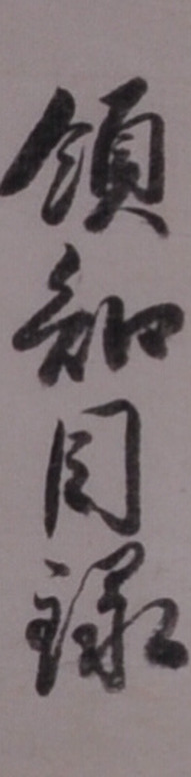領知目録

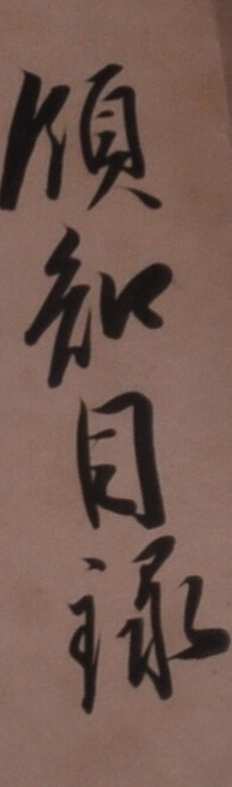領知目録
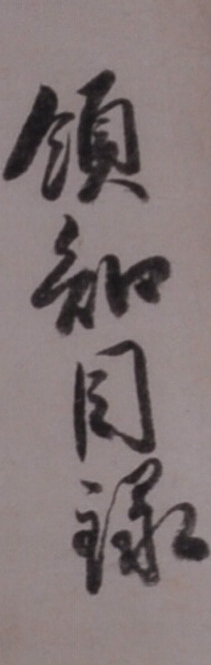領知目録
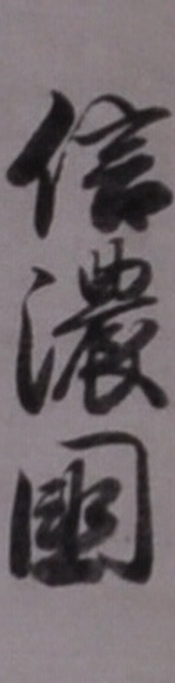信濃国
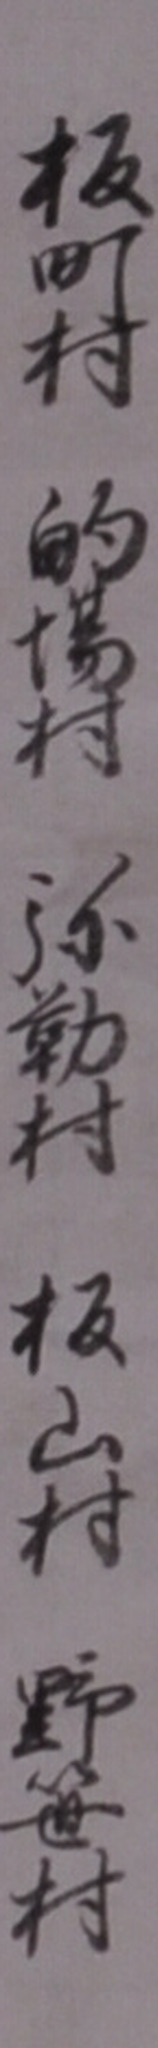板町村的場村弥勒村板山村野笹村
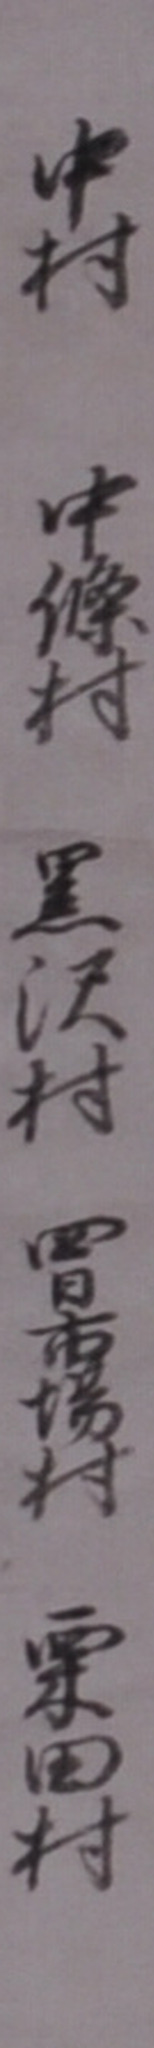中村中条村黒沢村四日市場村栗田村
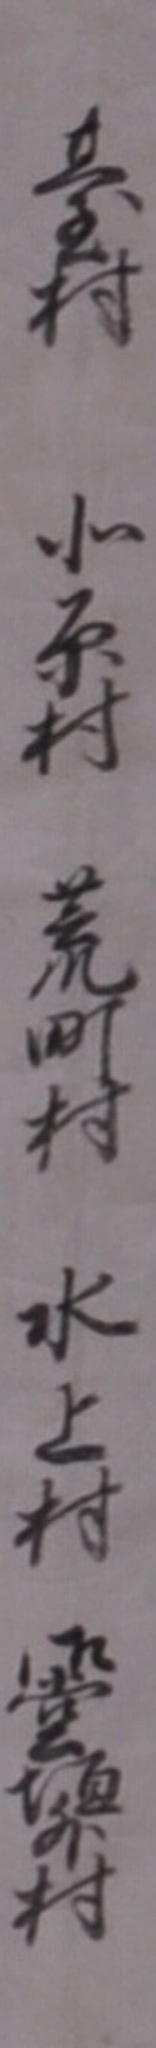台村北原村荒町村水上村御堂垣外村
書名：御朱印写・領地目録
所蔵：伊那市立高遠町図書館・合同会社AMANE
